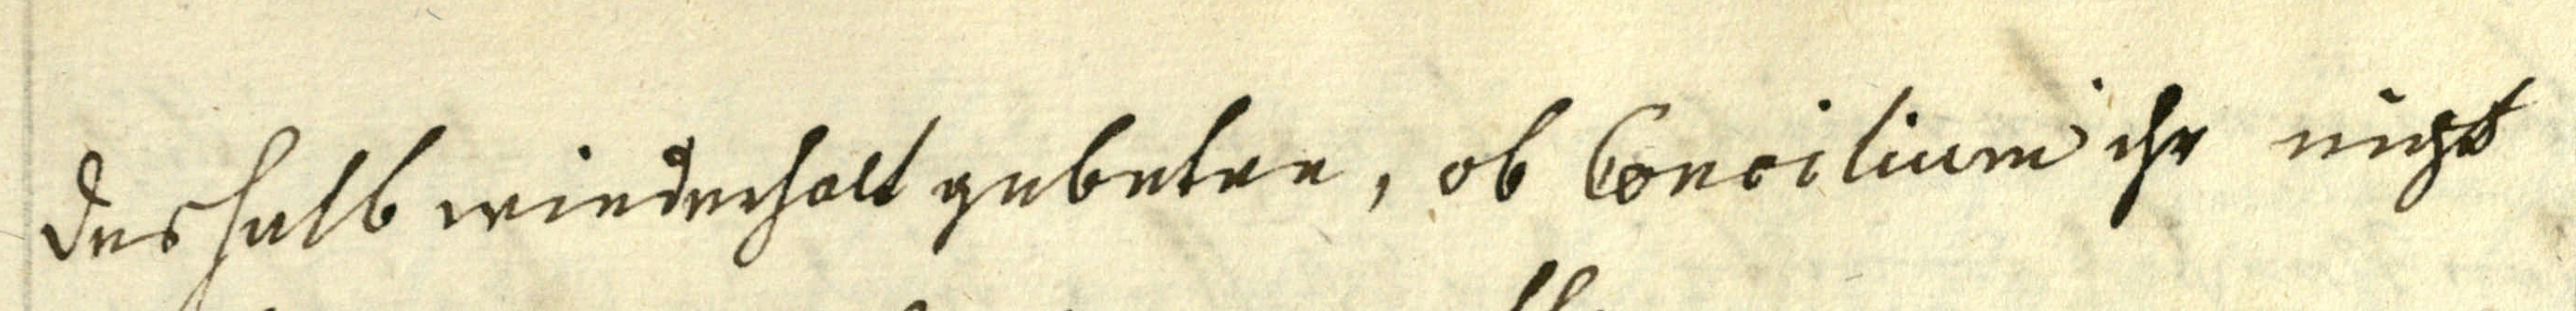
deshalb wiederholt gebeten, ob Concilium ihr nicht
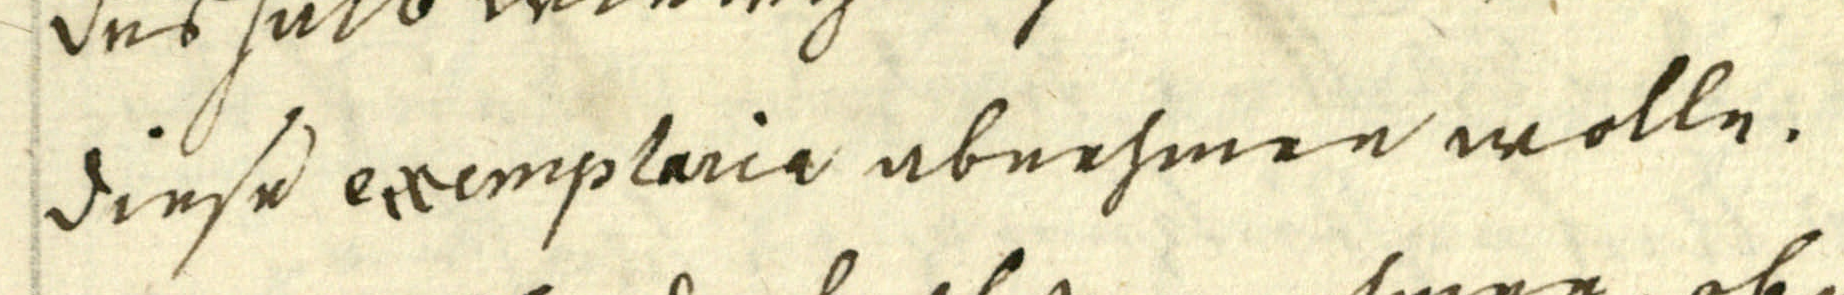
diese exemplaria abnehmen wolle.
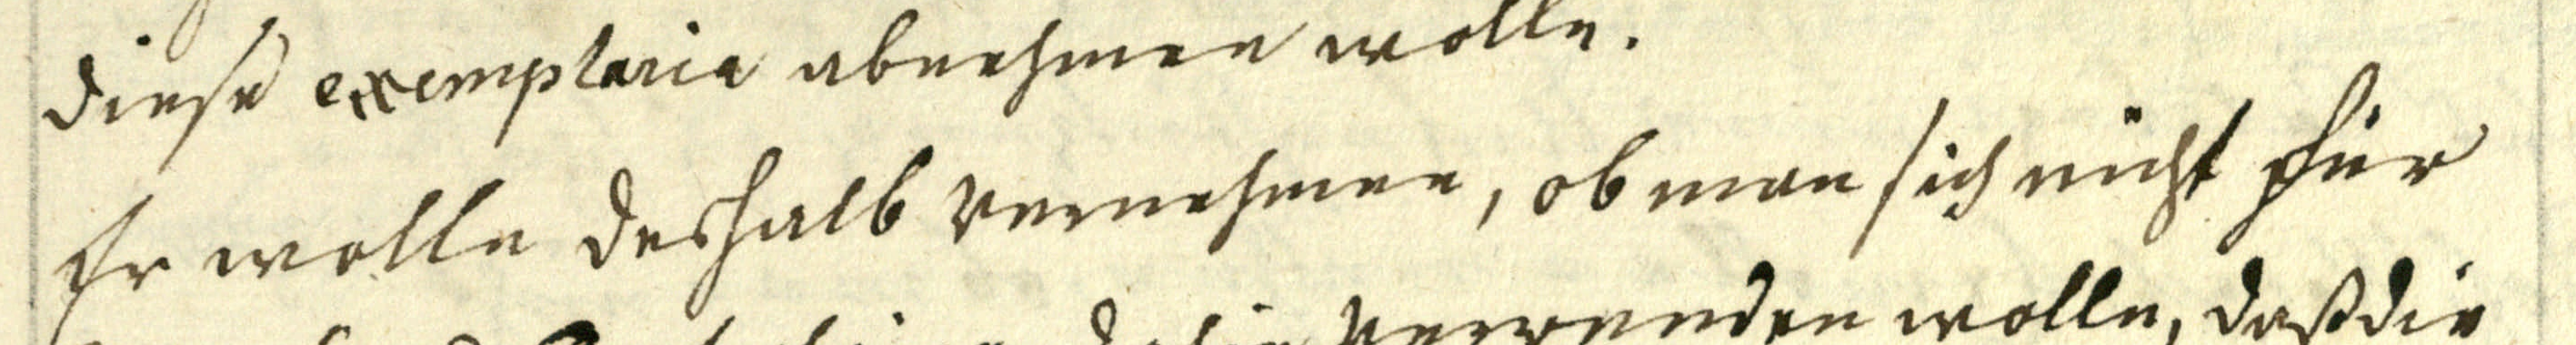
Er wolle deshalb vernehmen, ob man sich nicht für
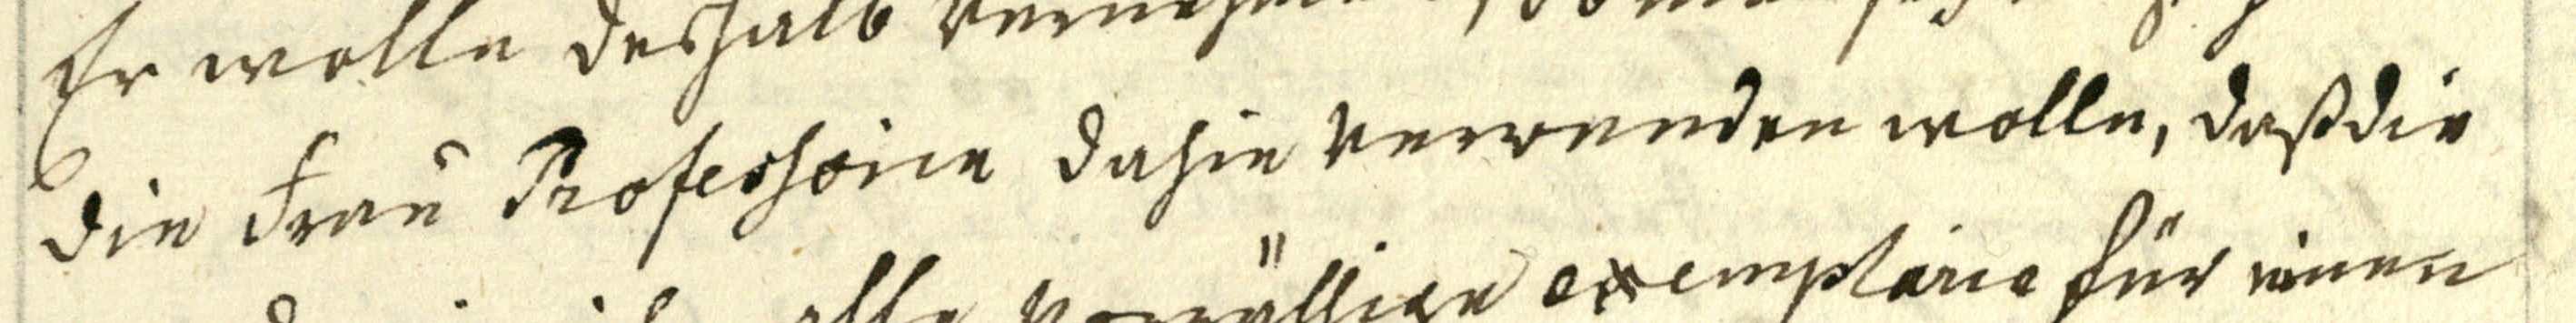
die Frau Professorin dahin verwenden wolle, daß die
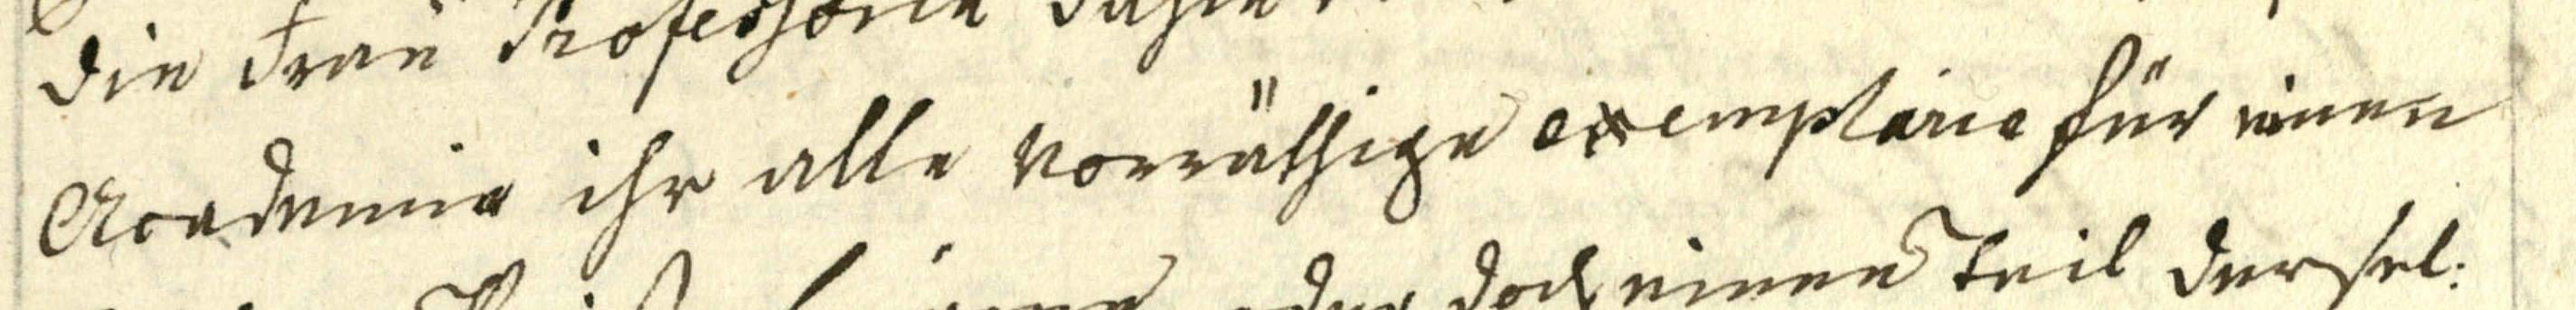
Academie ihr alle vorräthige exemplaria für einen
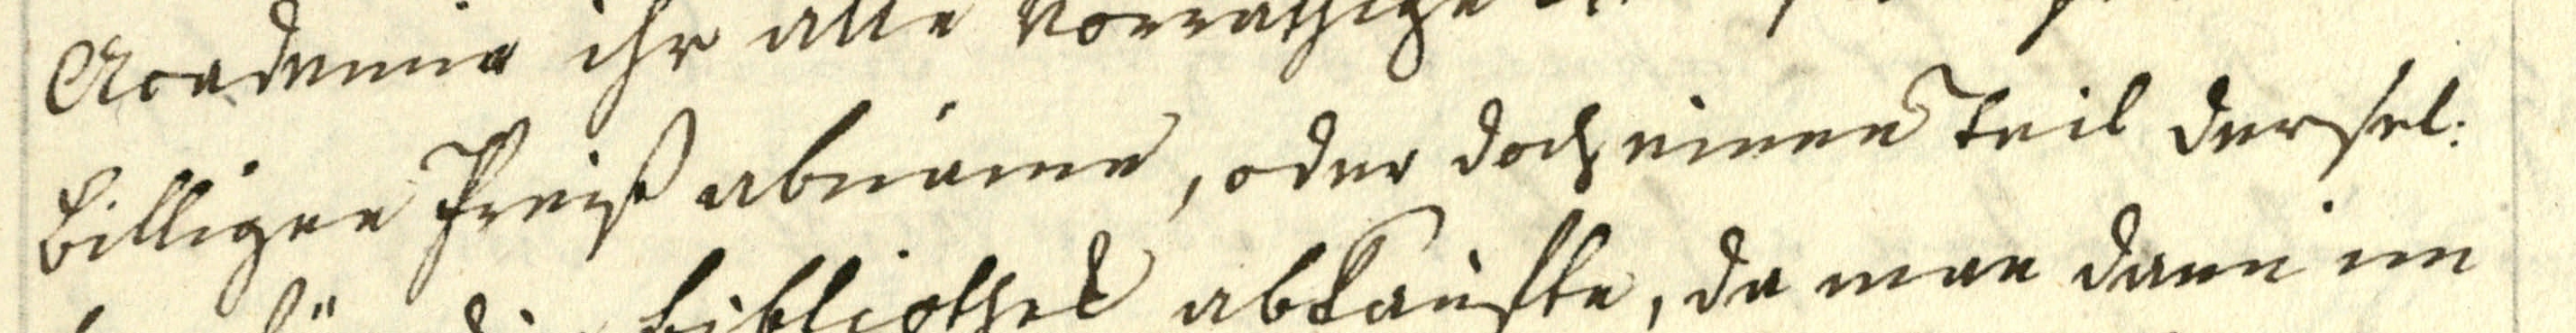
billigen Preiß abnäme, oder doch einen Teil dersel¬
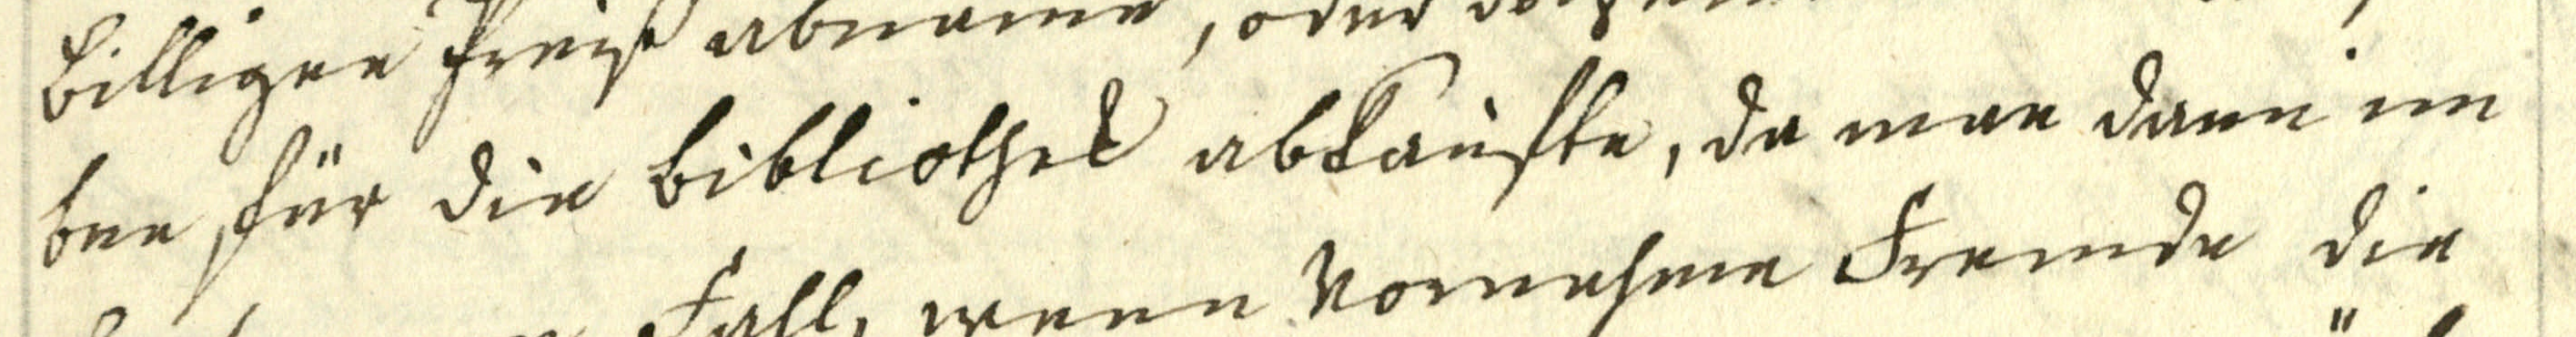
ben für die Bibliothek abkaufte, da man dann im
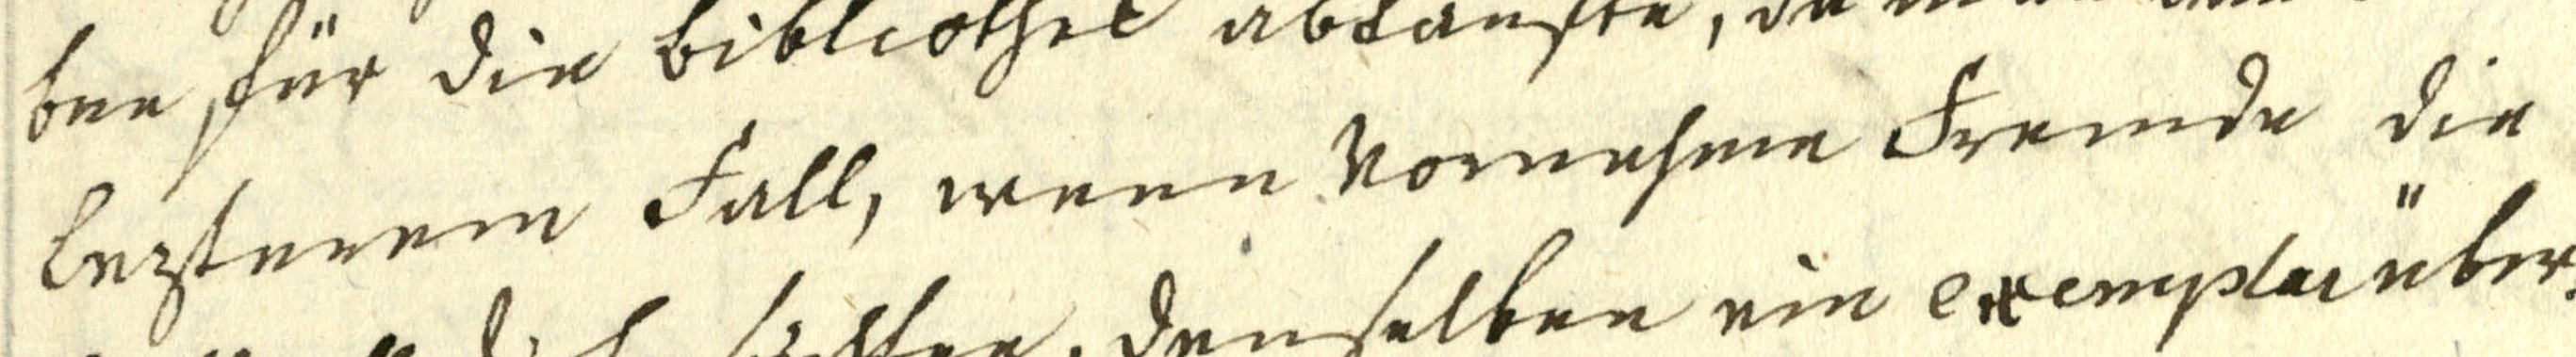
lezterem Fall, wenn vornehmen Freunde die
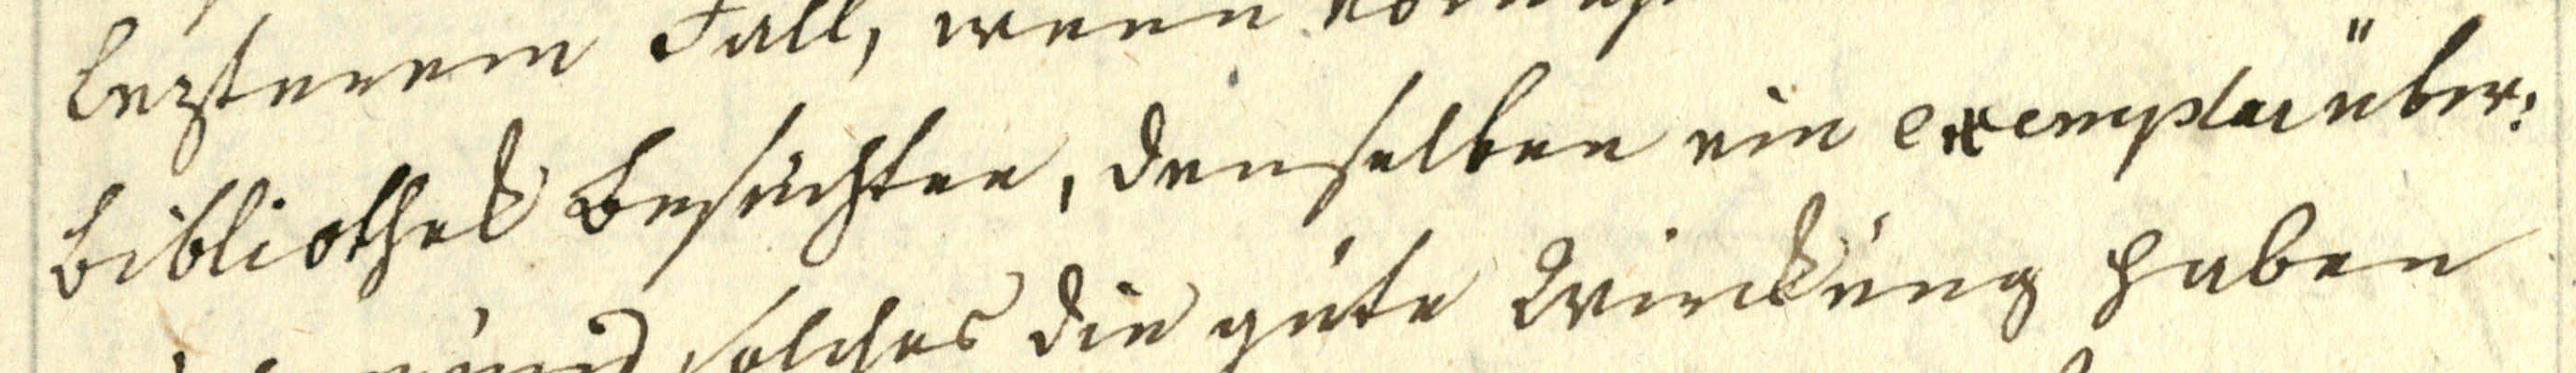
Bibliothek besuchten, denselben ein exemplar über¬
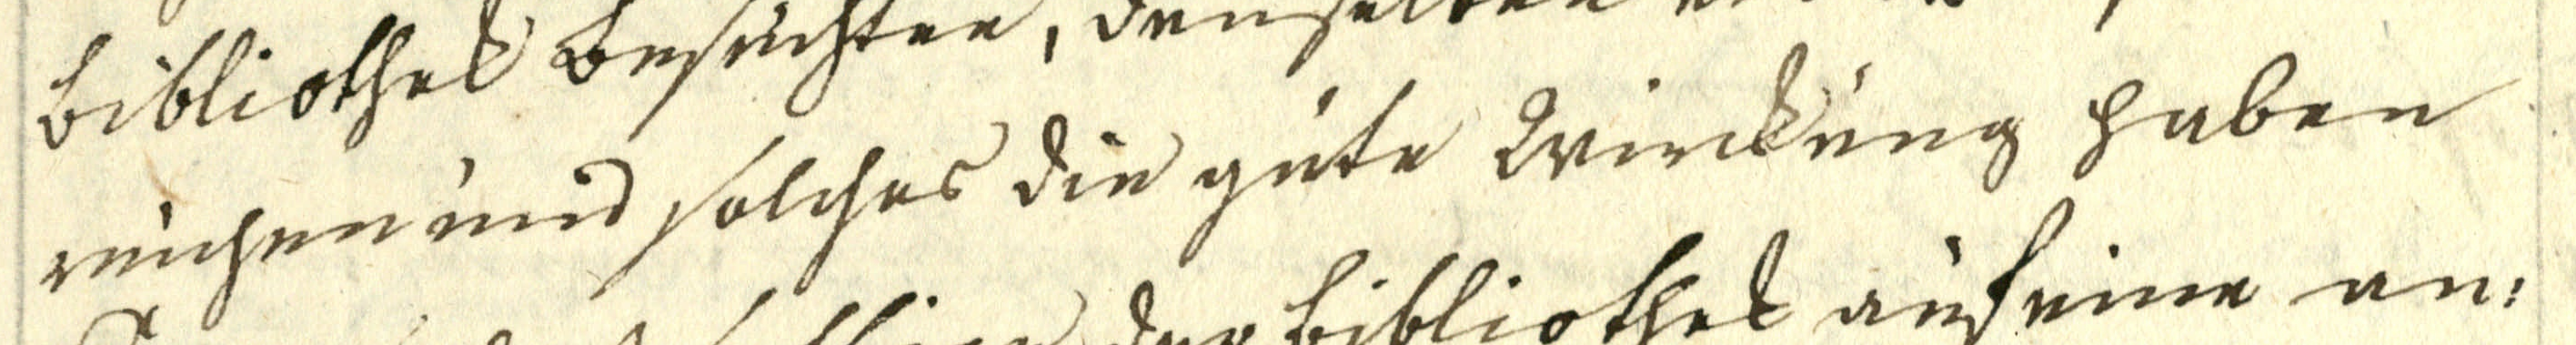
reichen und solches die gute Wirckung haben
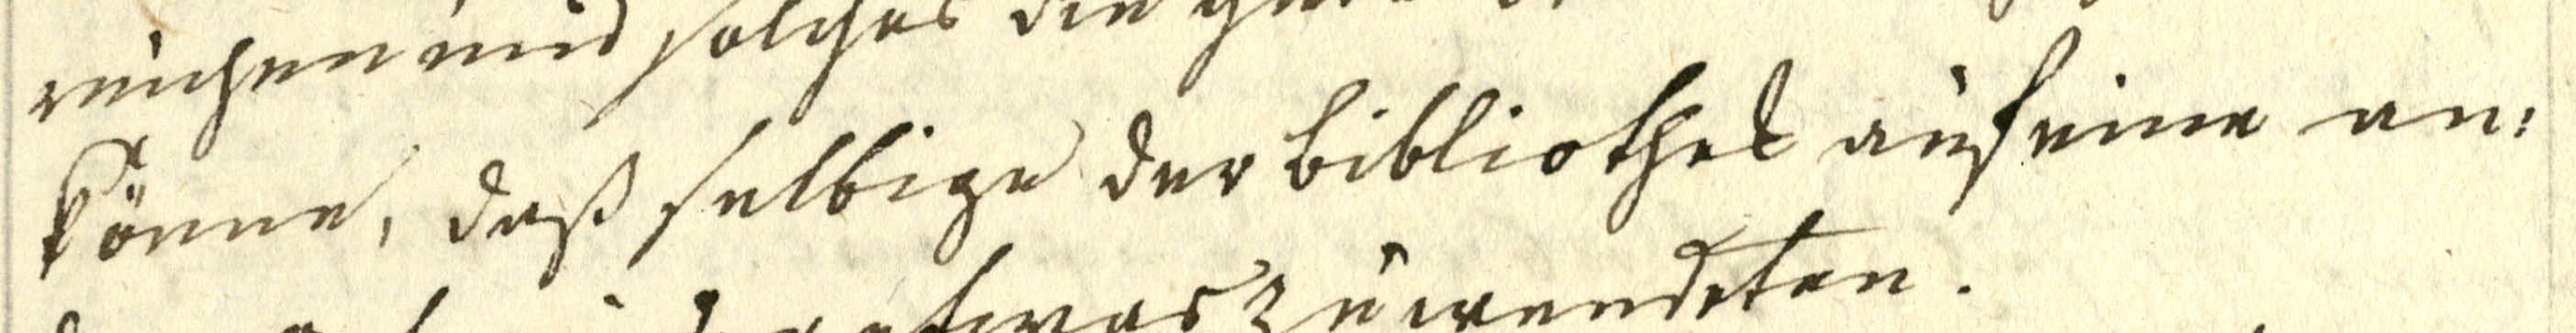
könne, daß selbige der Bibliothek auf eine an¬
